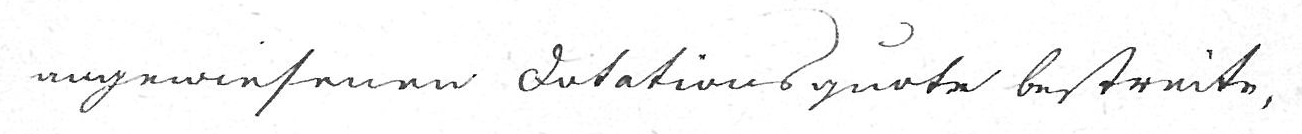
angewiesenen Dotationsquote bestreite,
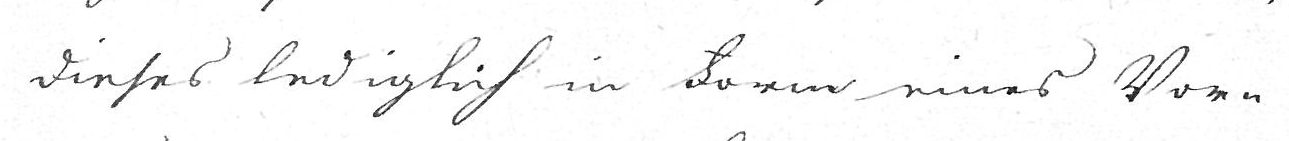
dieses lediglich in Form eines Vor-
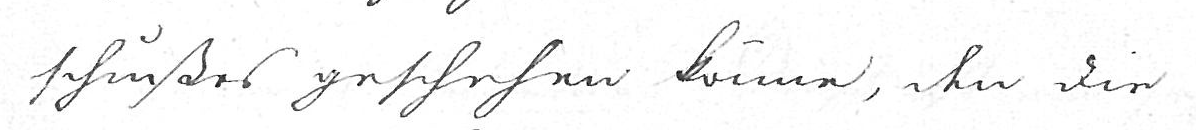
schußes geschehen könne, den die
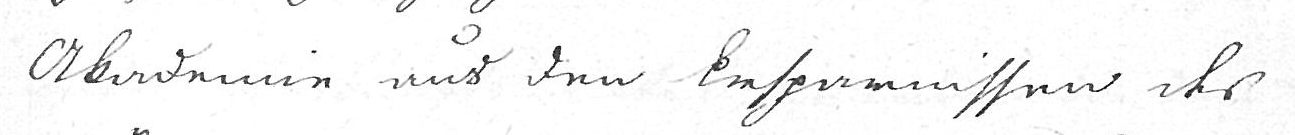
Akademie aus den Ersparnissen des
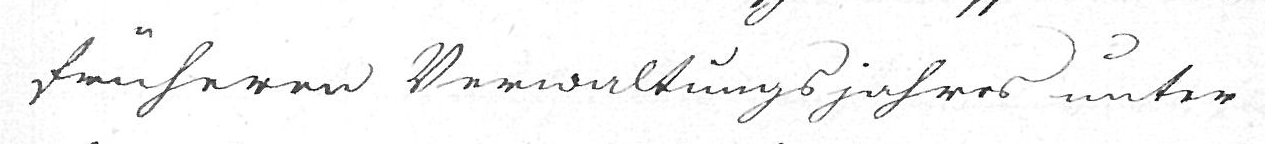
früheren Verwaltungsjahres unter
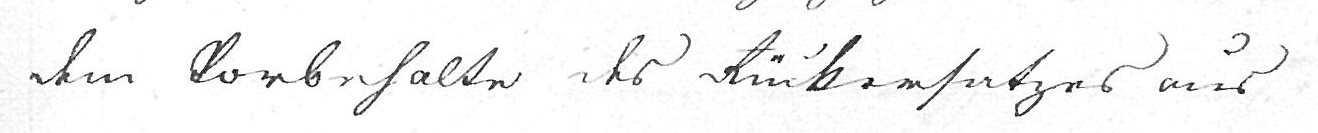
dem Vorbehalte des Rückersatzes aus
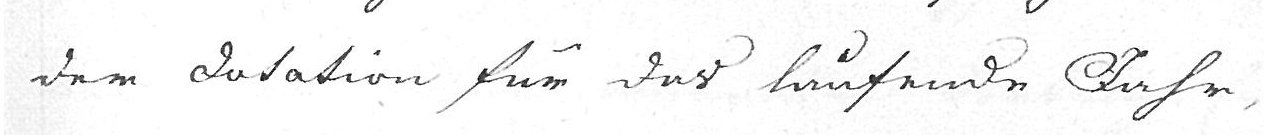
der Dotation für das laufende Jahr
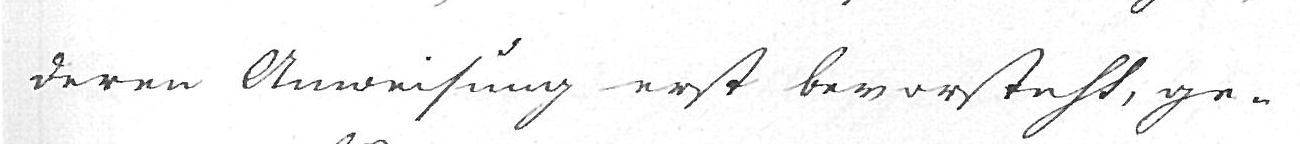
deren Anweisung erst bevorsteht, ge-
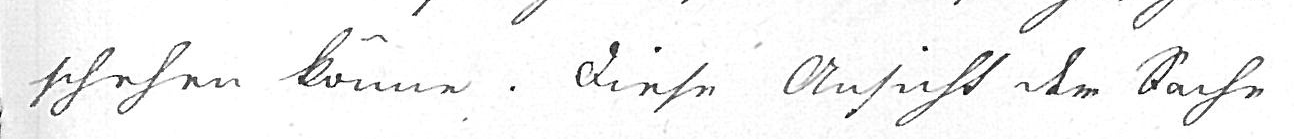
schehen könne. Diese Ansicht der Sache
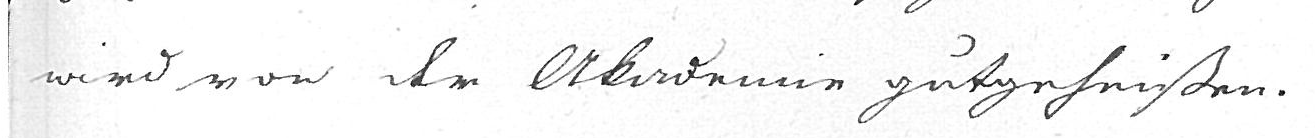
wird von der Akademie gutgeheiße.
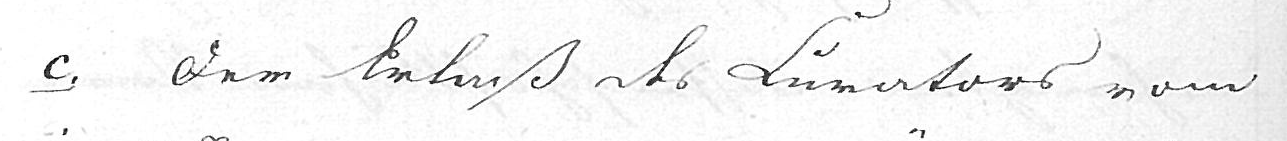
c. Der Erlaß des Curators vom
